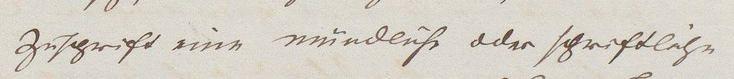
Zuschrift eine mündliche oder schriftliche
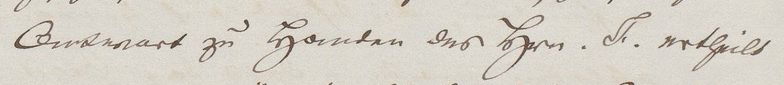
Antwort zu Handen des Hrn. F. ertheilt
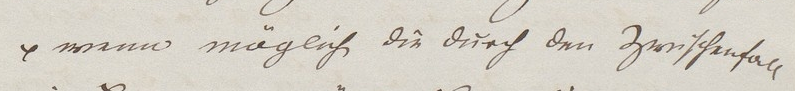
& wenn möglich die durch den Zwischenfall
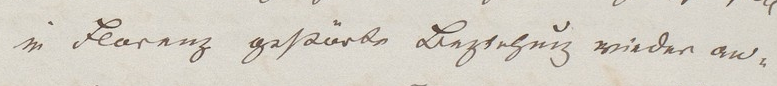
in Florenz gestörte Beziehung wieder an-
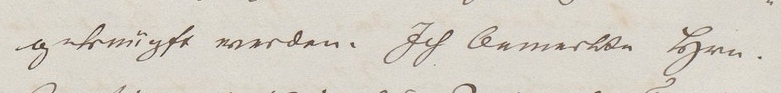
geknüpft werden. Ich bemerkte Hrn.
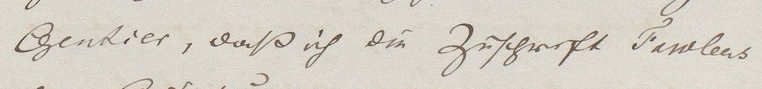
Gentili, daß ich die Zuschrift Fowlers
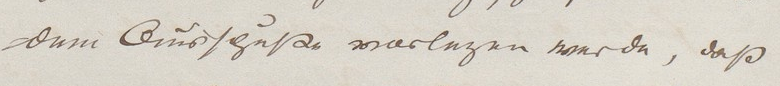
dem Ausschuße vorlegen werde, daß
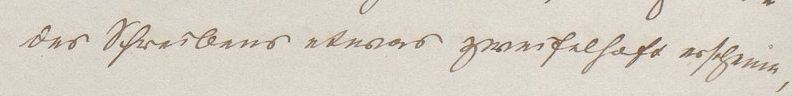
des Schreibens etwas zweifelhaft erscheine,
